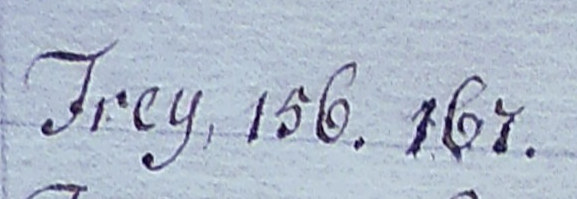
Frey, 156. 167.
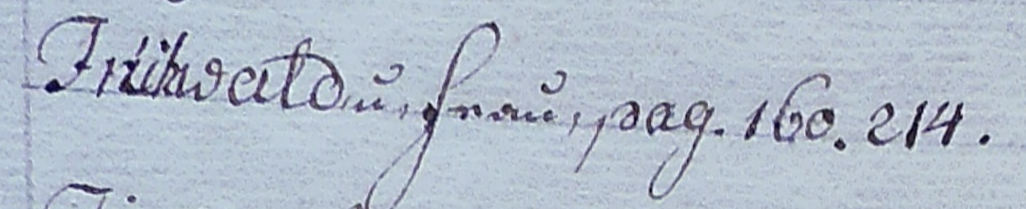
Frühwald, u, Frau, pag. 160. 214.
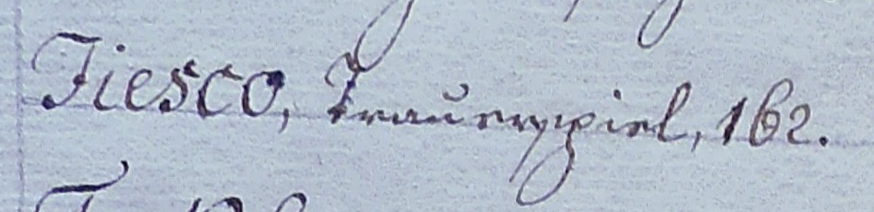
Fiesco, Trauerspiel, 162.
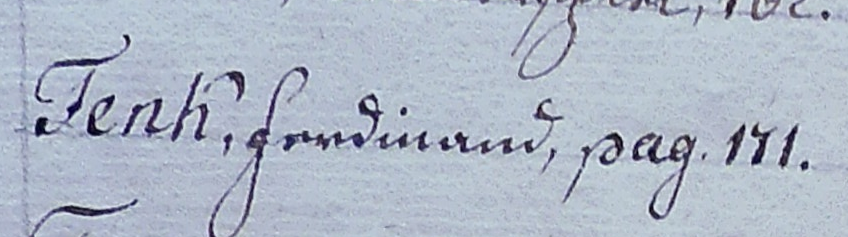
Fenk, Ferdinand, pag. 171.
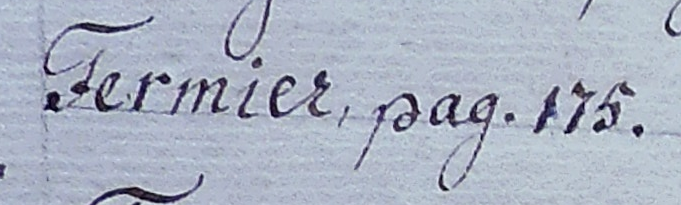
Fermier, pag. 175.
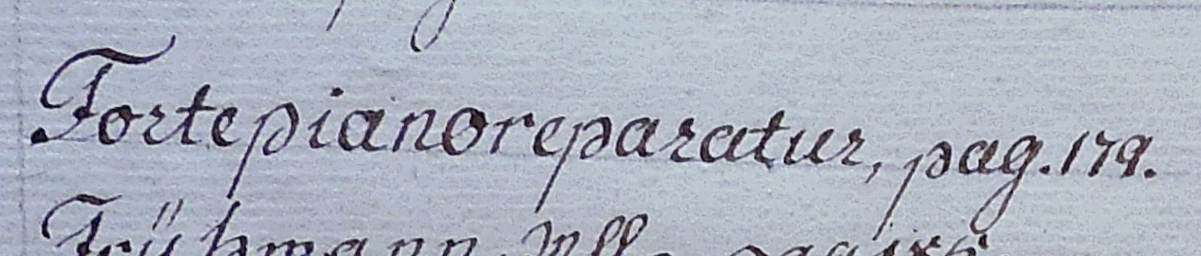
Fortepianoreparatur, pag. 179.
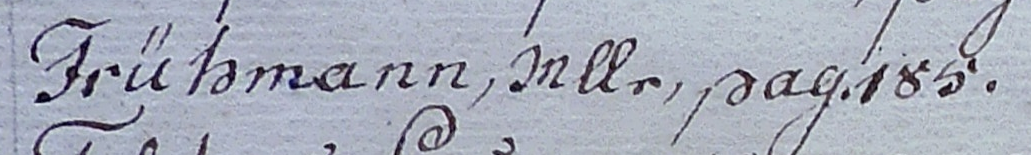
Frühmann, Mlle, pag. 185.
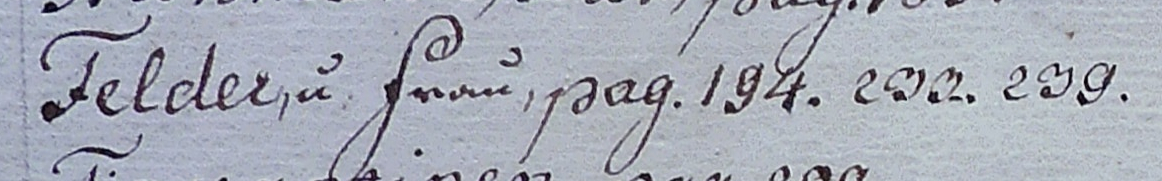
Felder,u Frau, pag. 194. 233. 239.
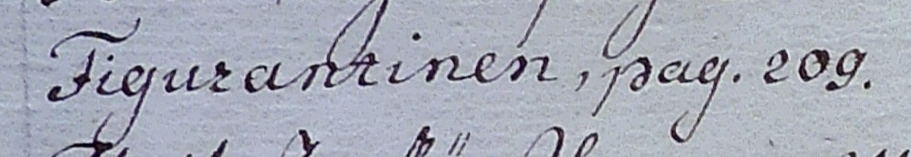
Figurantinen, pag. 209.
